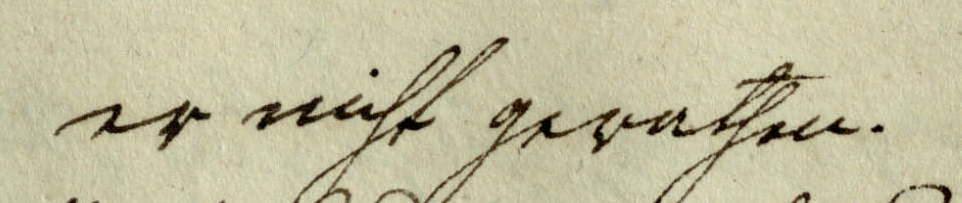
er nicht gerathen.
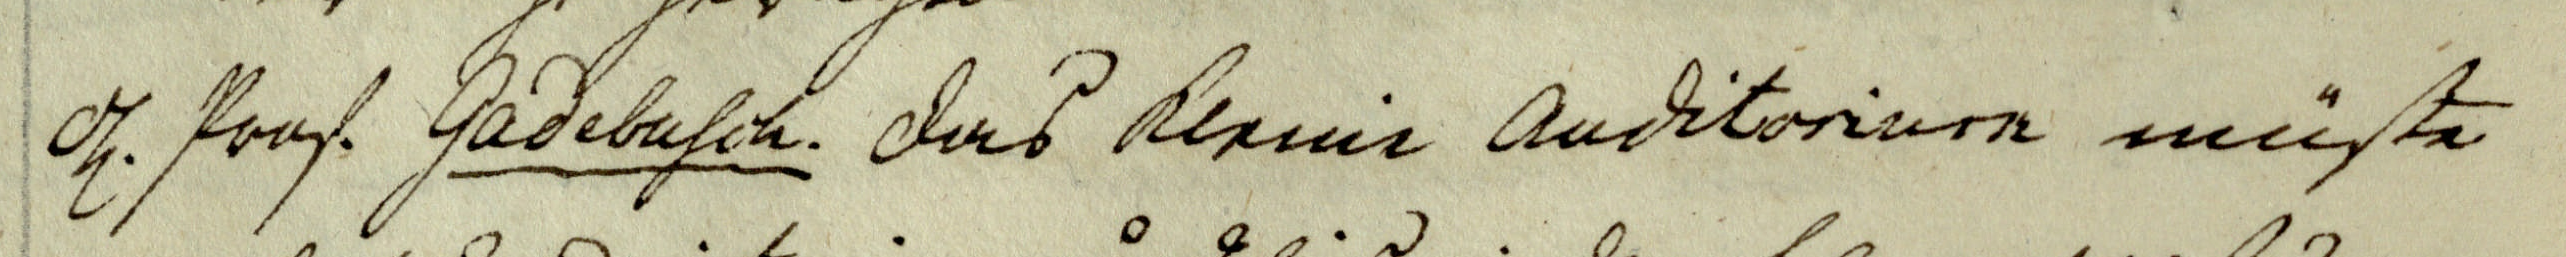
dh. Prof. Gadebusch. Das kleine Auditorium müßte
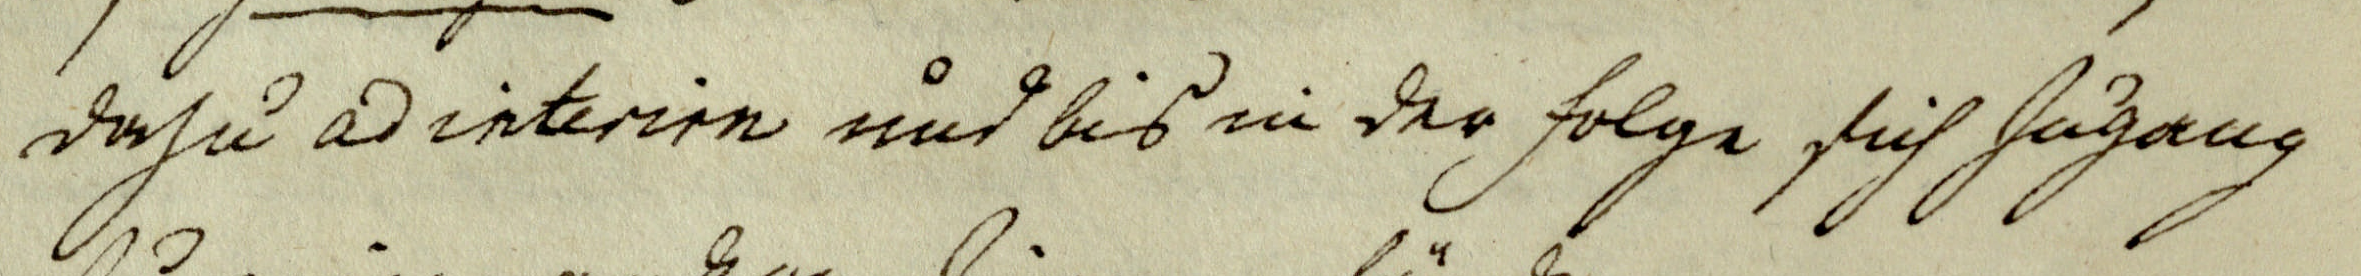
dazu ad interim und bis in der Folge sich Zugang
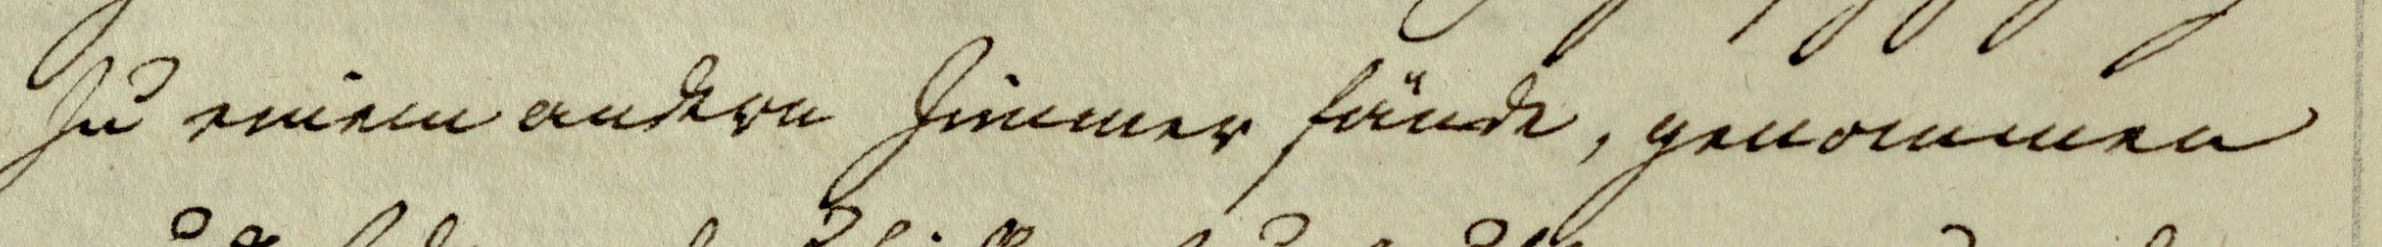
zu einem andern Zimmer fände, genommen
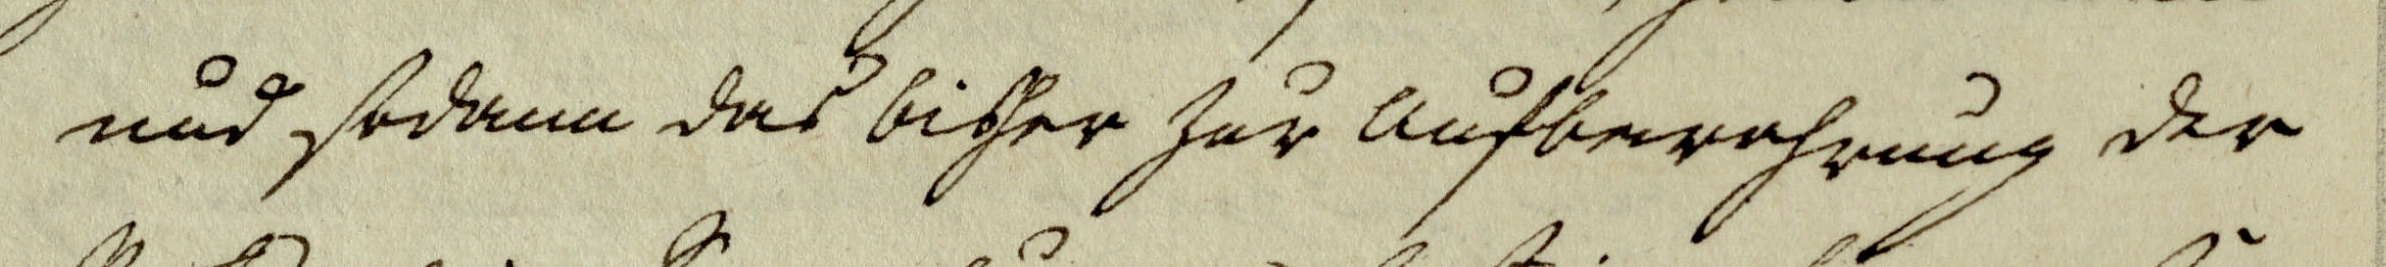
und sodann das bisher zur Aufbewahrung der
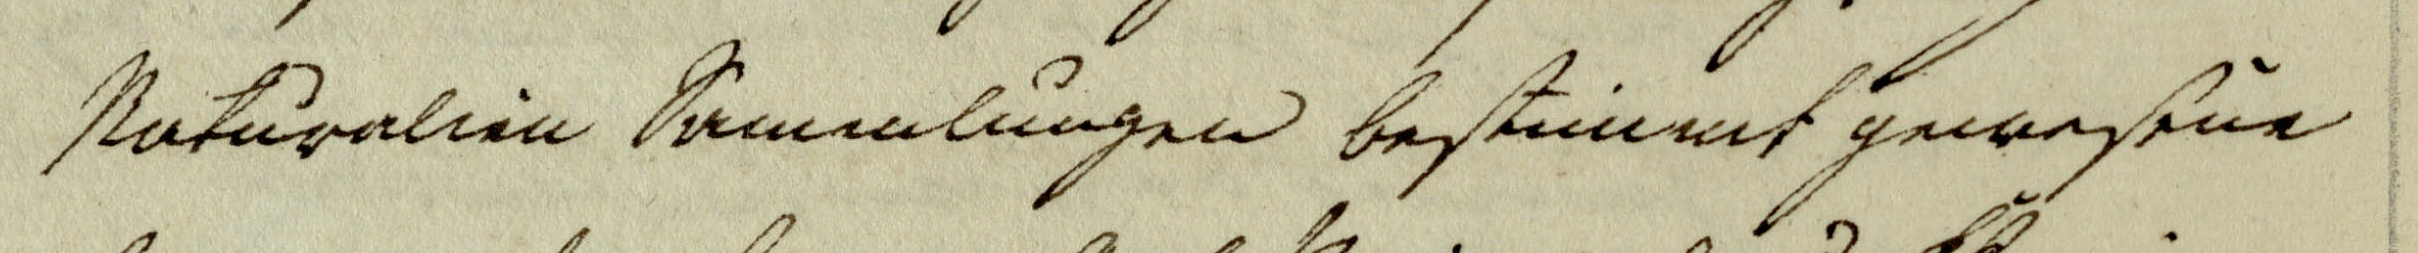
Naturalien Sammlungen bestimmt gewesene
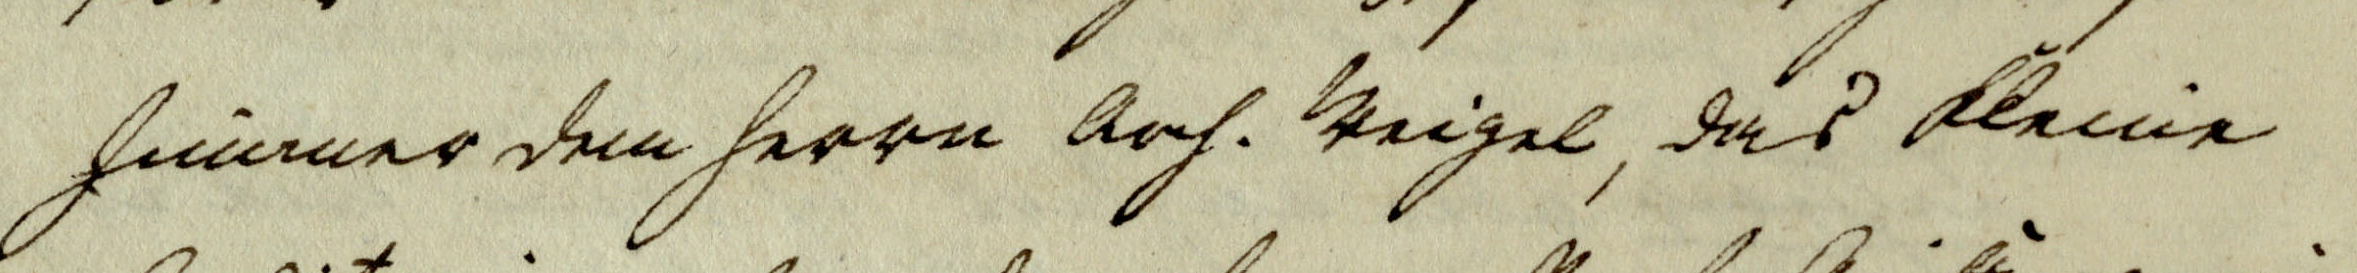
Zimmer dem Herrn Arch. Weigel, das kleine
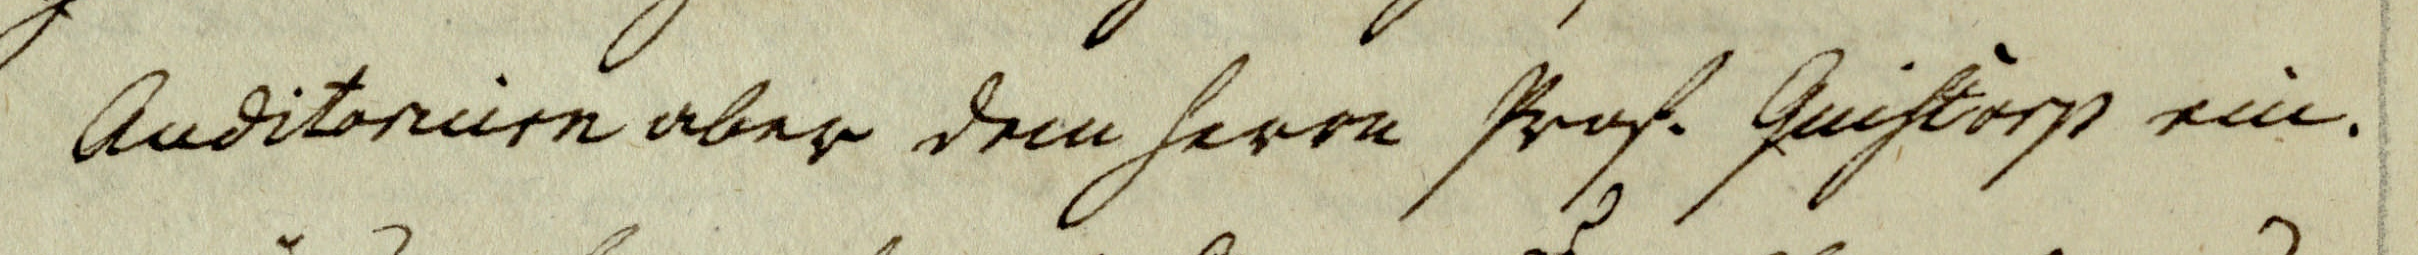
Auditorium aber dem Herrn Prof. Quistorp ein¬
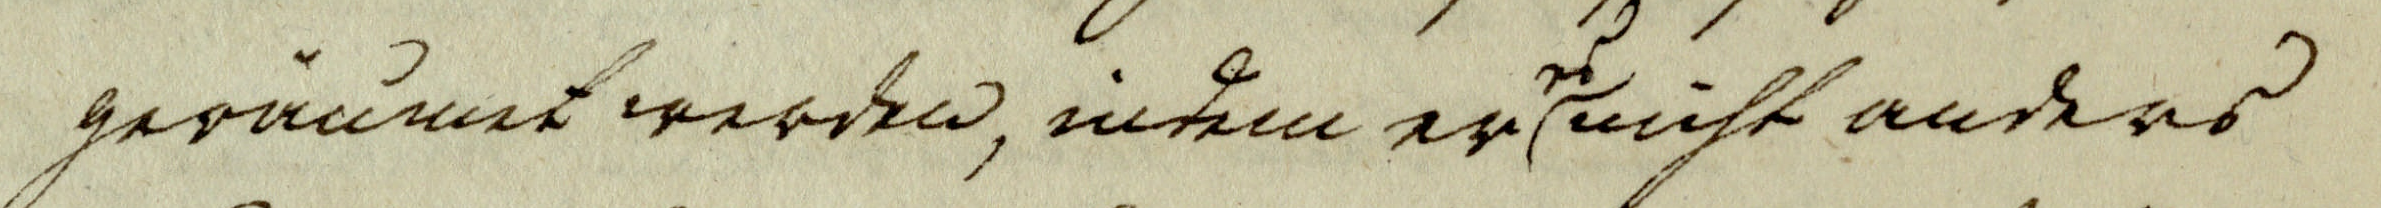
geräumet werden, indem er es nicht anders
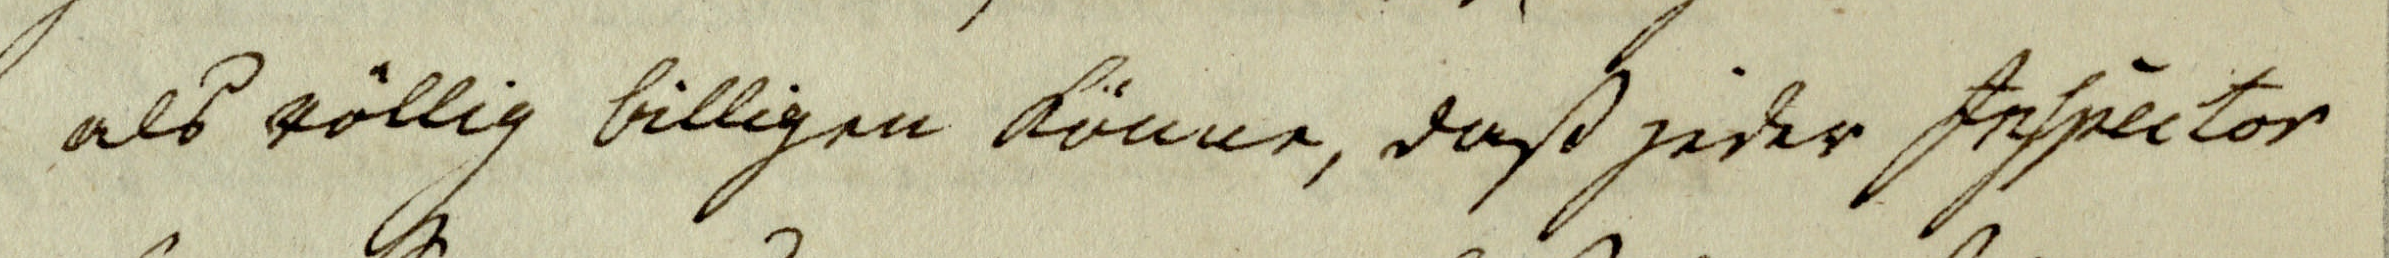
als völlig billigen könne, daß jeder Inspector
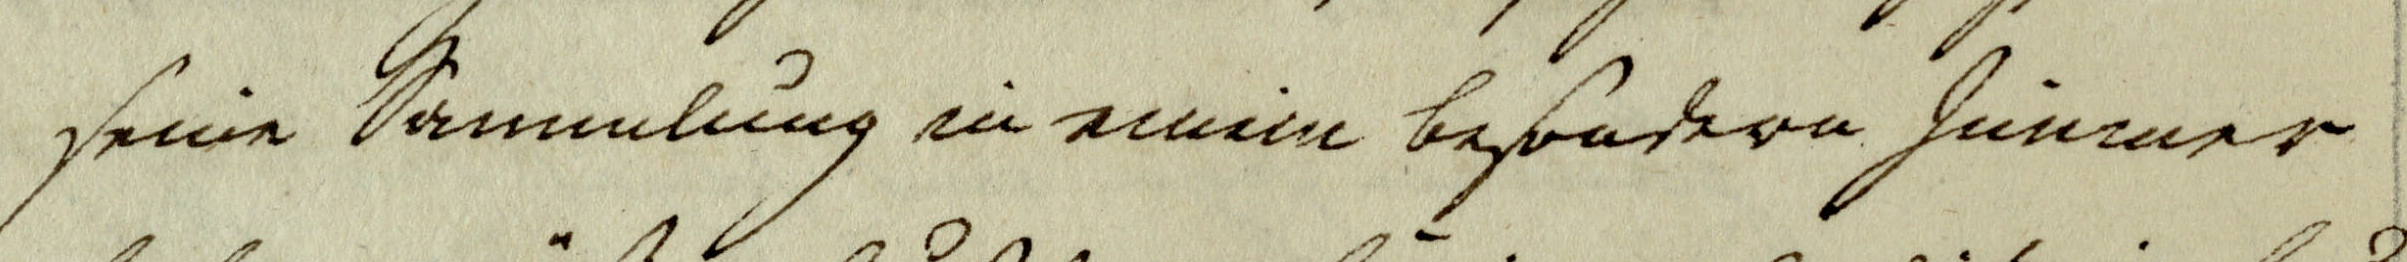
seine Sammlung in einem besondern Zimmer
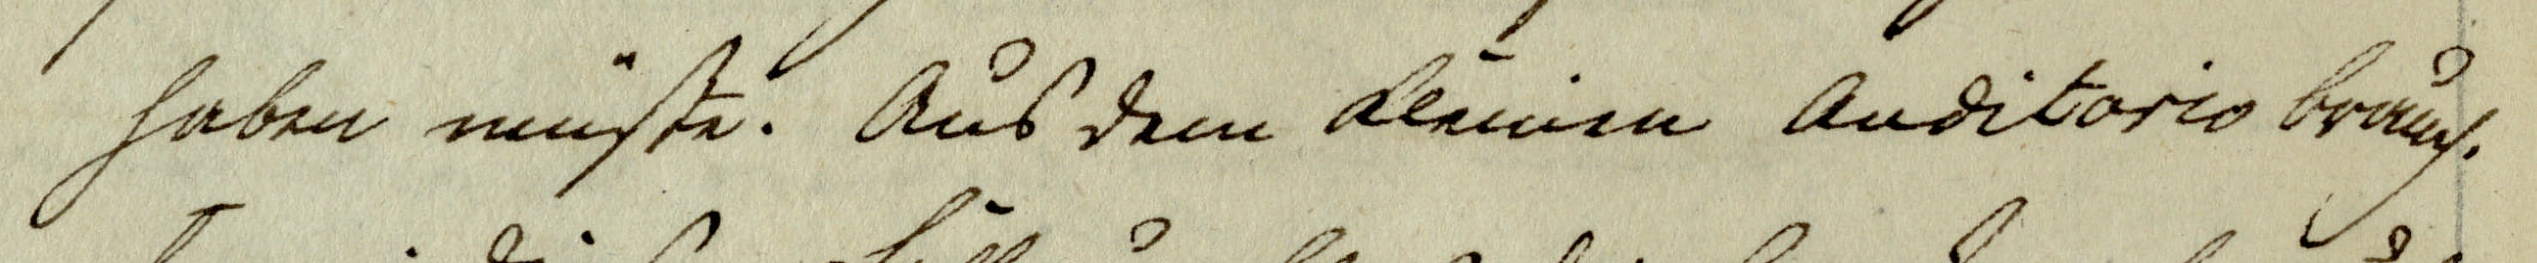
haben müßte. Aus dem kleinen Auditorio brauch¬
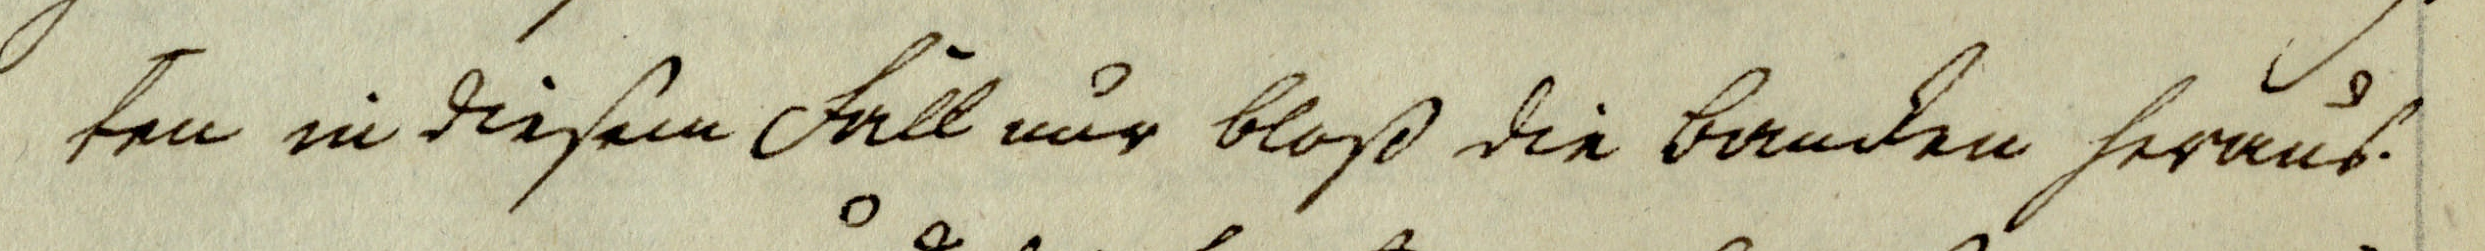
ten in diesem Fall nur bloß die Bancken heraus¬
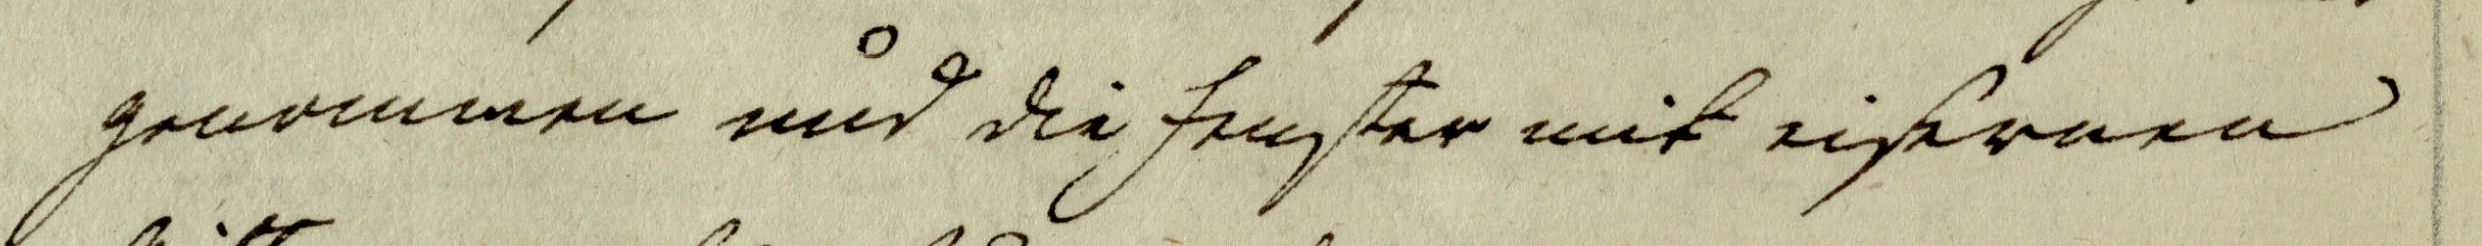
genommen und die Fenster mit eisernen
